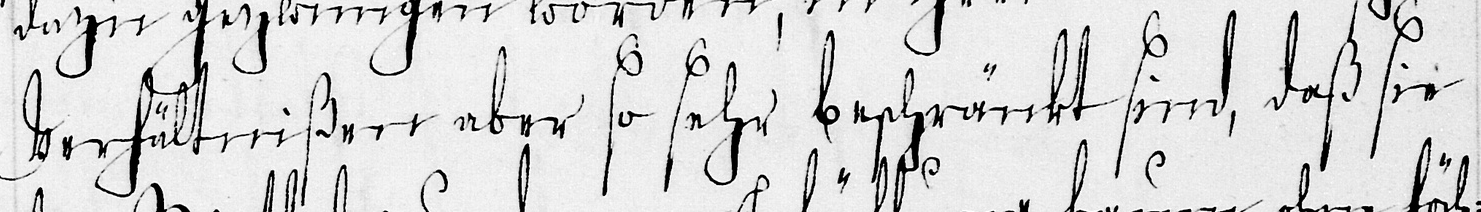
Verhältnißen aber so sehr beschränkt sind, daß sie
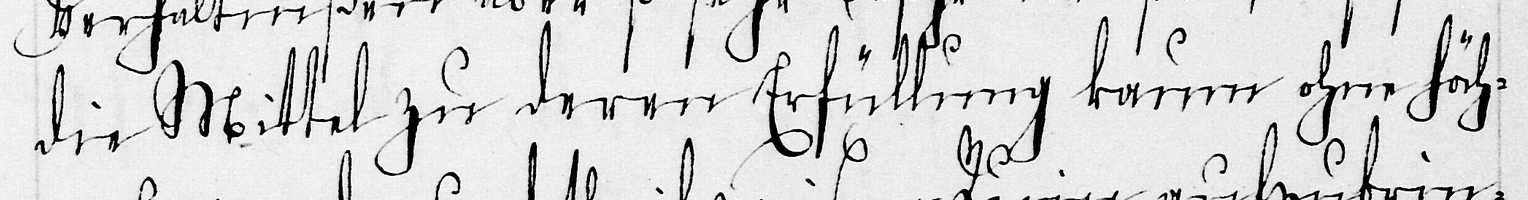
die Mittel zu deren Erfüllung kaum ohne Höch¬
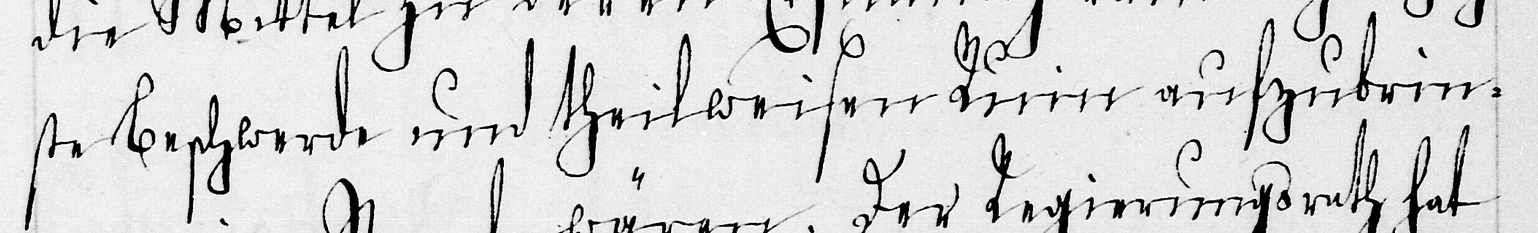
ste Beschwerde und theilweisen Ruin aufzubrin¬
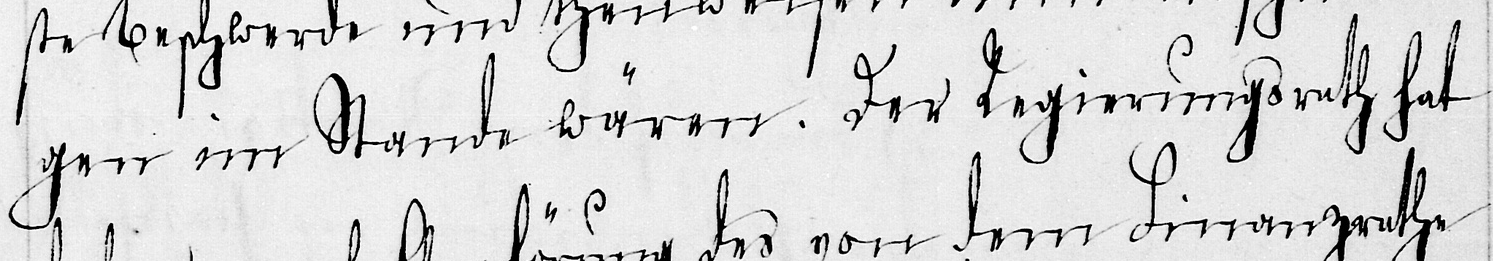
gen im Stande wären. Der Regierungsrath hat
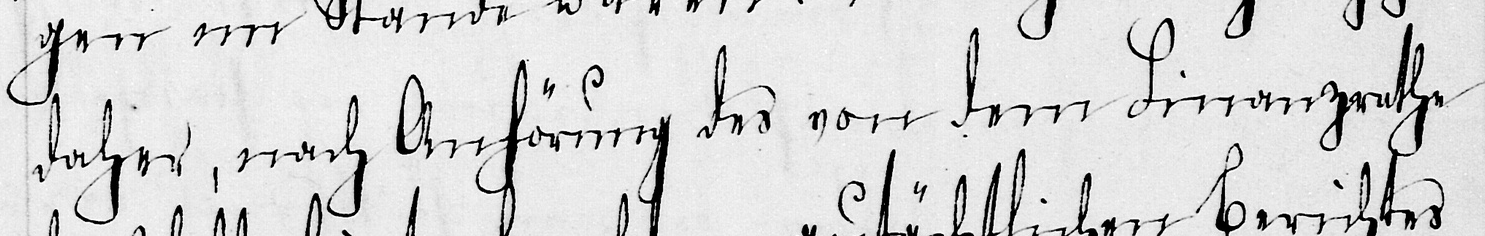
daher, nach Anhörung des von dem Finanzrathe
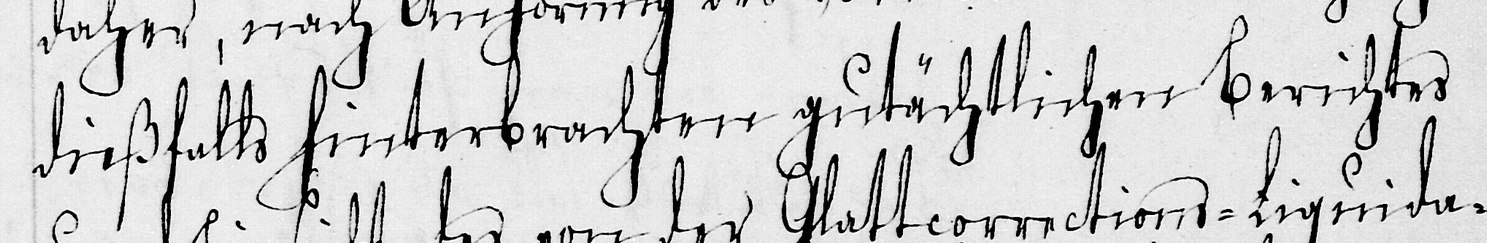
dießfalls hinterbrachten gutächtlichen Berichtes
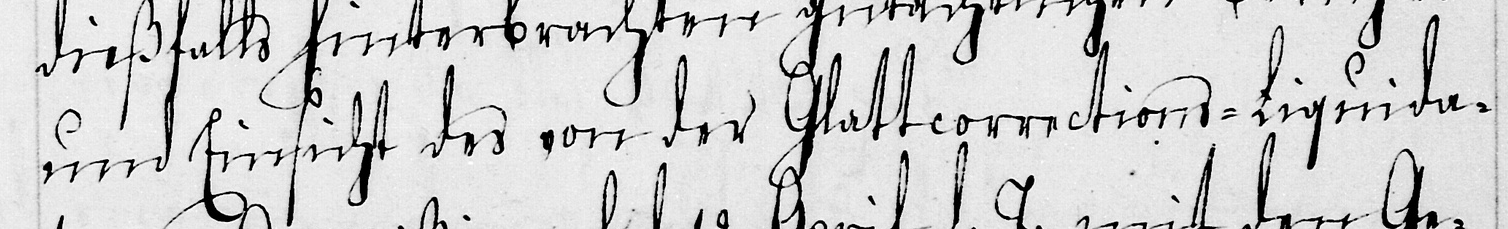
und Einsicht des von der Glattcorrections-Liquida¬
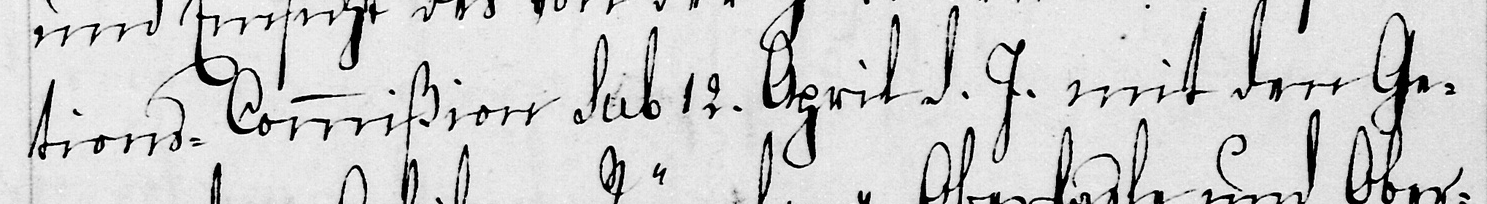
tions-Commißion sub 12. April d. J. mit den Ge¬
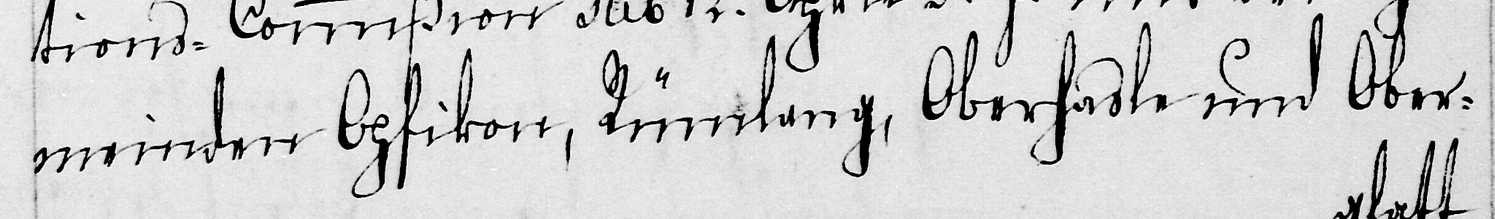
meinden Opfikon, Rümlang, Oberhasle und Ober-
